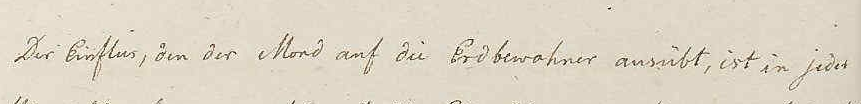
Der Einflus, den der Mond auf die Erdbewohner ausübt, ist in jeder
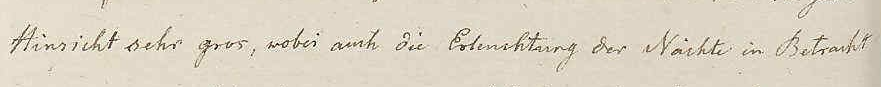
Hinsicht sehr gros, wobei auch die Erleuchtung der Nächte in Betracht
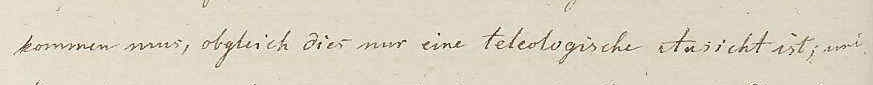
kommen mus, obgleich dies nur eine teleologische Ansicht ist; und
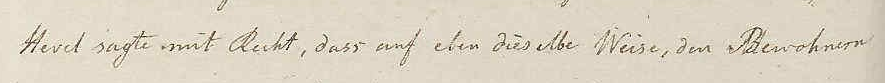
Hevel sagte mit Recht, dass auf eben dieselbe Weise, den Bewohnern
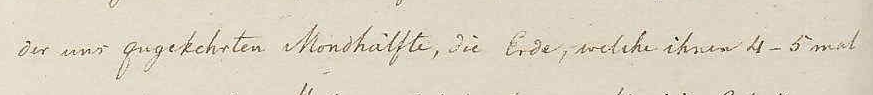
der uns zugekehrten Mondhälfte, die Erde, welche ihnen 4–5 mal
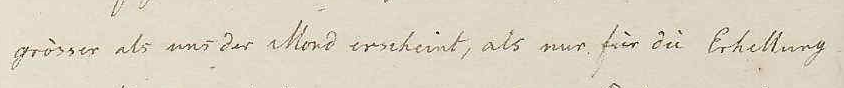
grösser als uns der Mond erscheint, als nur für die Erhellung
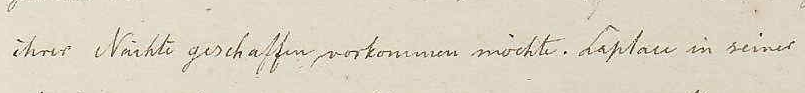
ihrer Nächte geschaffen vorkommen möchte. Laplace in seiner
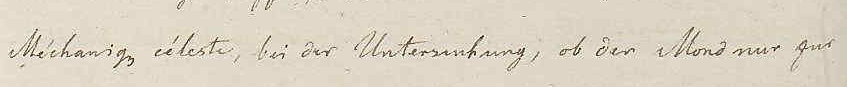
Méchaniq￼ céleste, bei der Untersuchung, ob der Mond nur zur
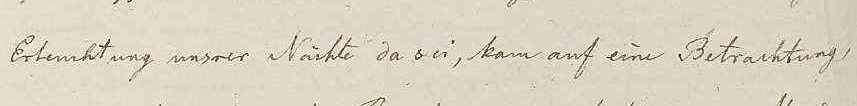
Erleuchtung unsrer Nächte da sei, kam auf eine Betrachtung,
